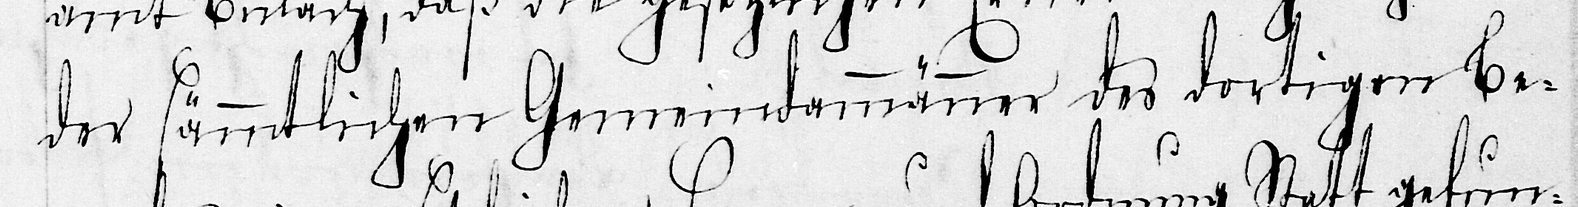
der sämmtlichen Gemeindammänner des dortigen Be¬
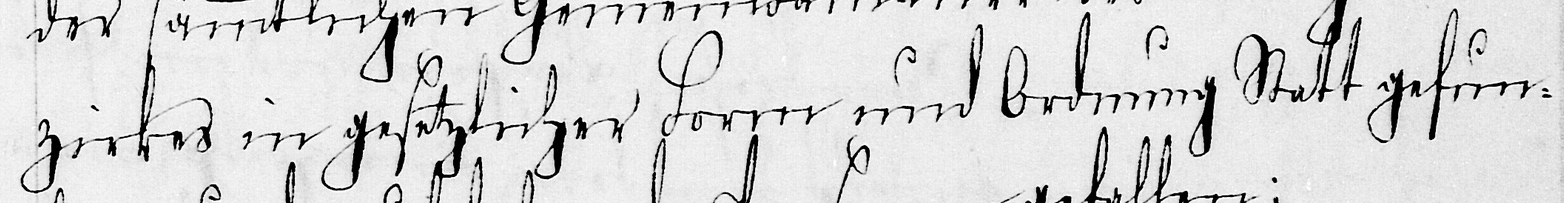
zirkes in gesetzlicher Form und Ordnung Statt gefun¬
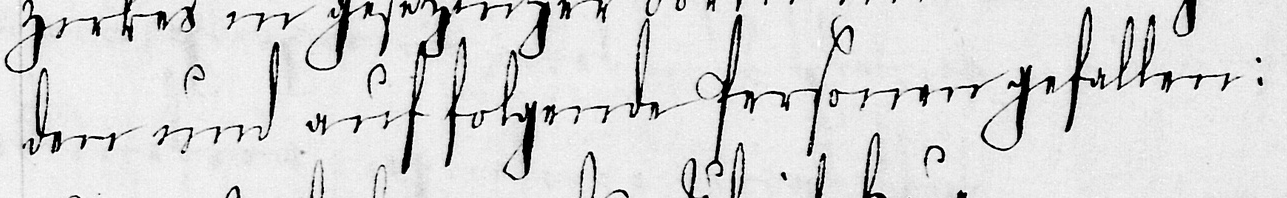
den und auf folgende Personen gefallen:
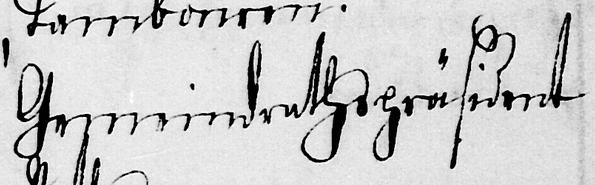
Gemeindrathspräsident
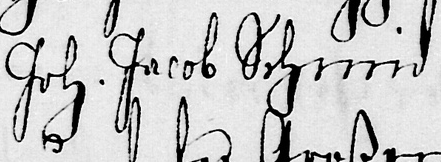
Joh. Jacob Schmid,
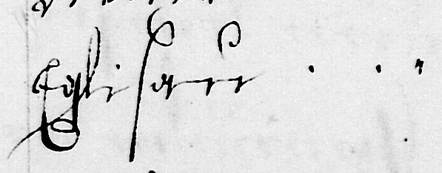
Eglisau
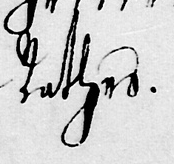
Rathes.
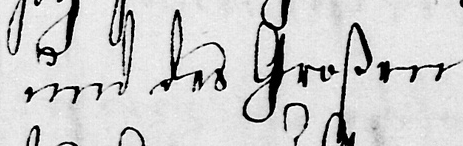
und des Großen
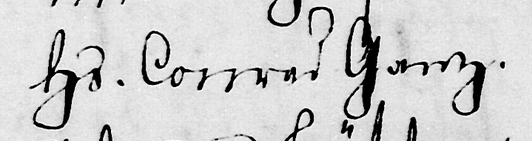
Hs. Conrad Ganz.
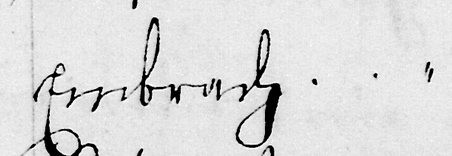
Embrach
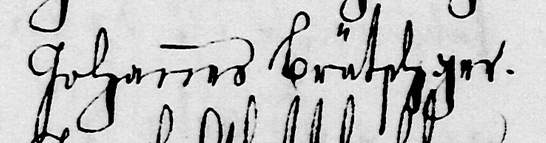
Johannes Brätschger.
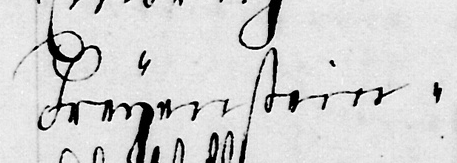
Freyenstein
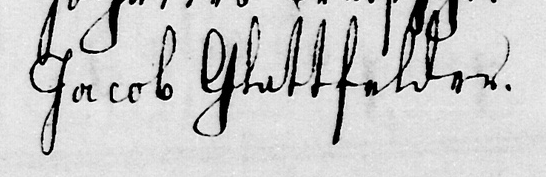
Jacob Glattfelder.
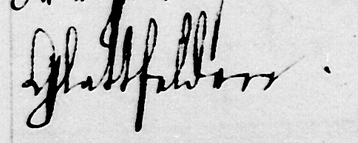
Glattfelden
